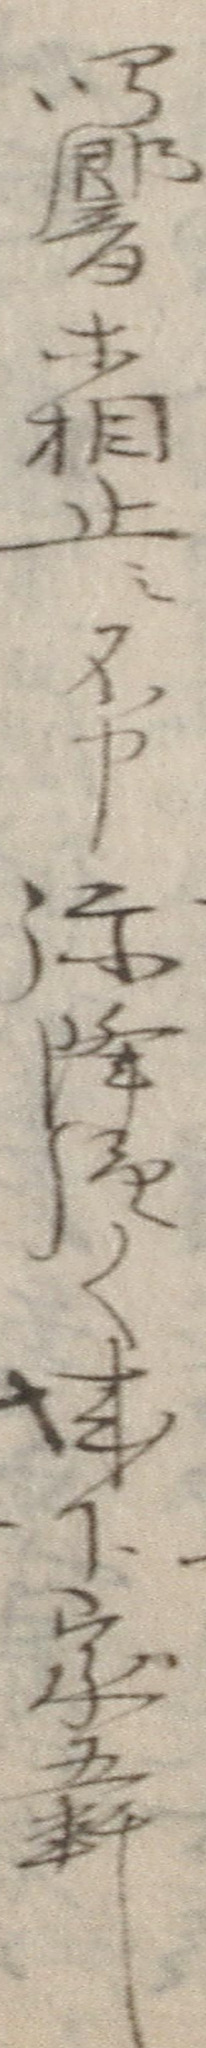鳴響等相止ミ不申弥降強く城下家五軒
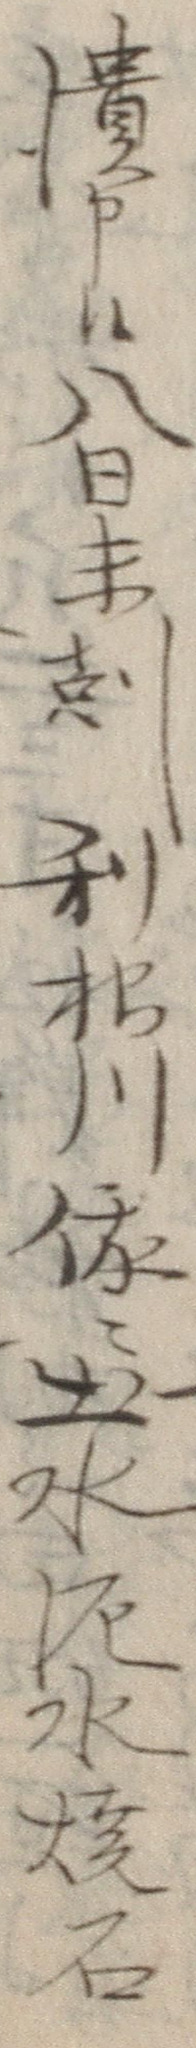潰申候八日未刻利根川俄ニ出水泥水焼石
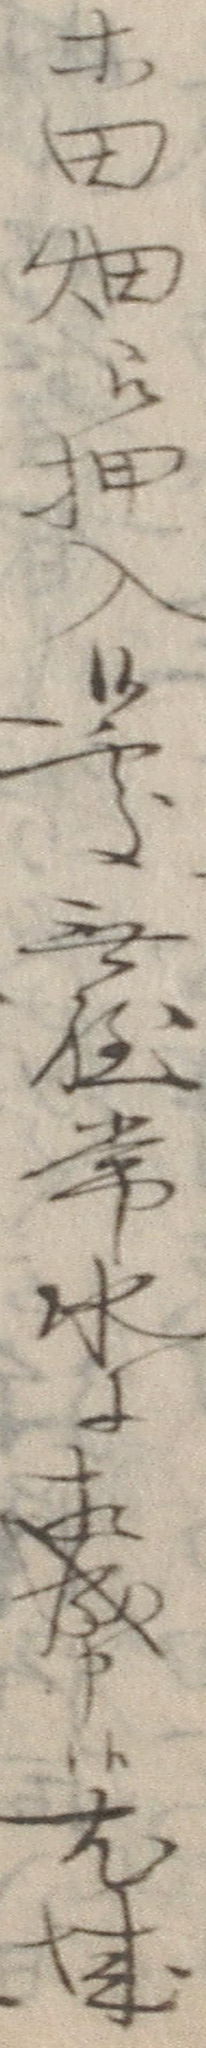等田畑え押入候処無程常水に相成申候尤城
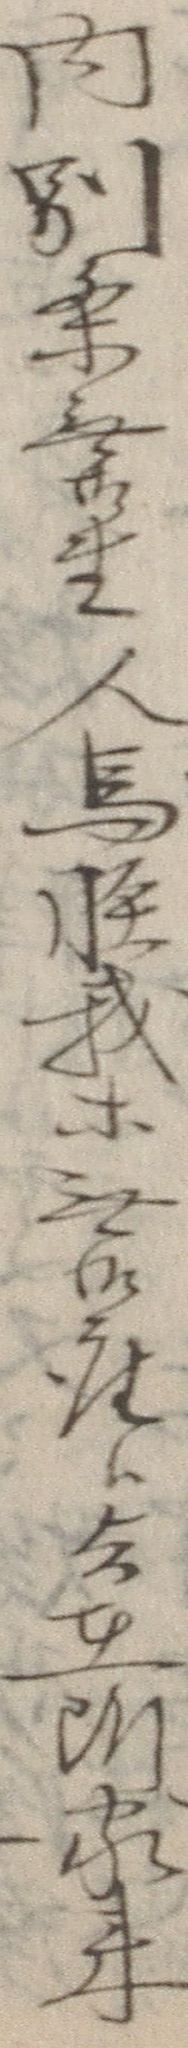内別条無御座人馬怪我等無御座候旨在所家来
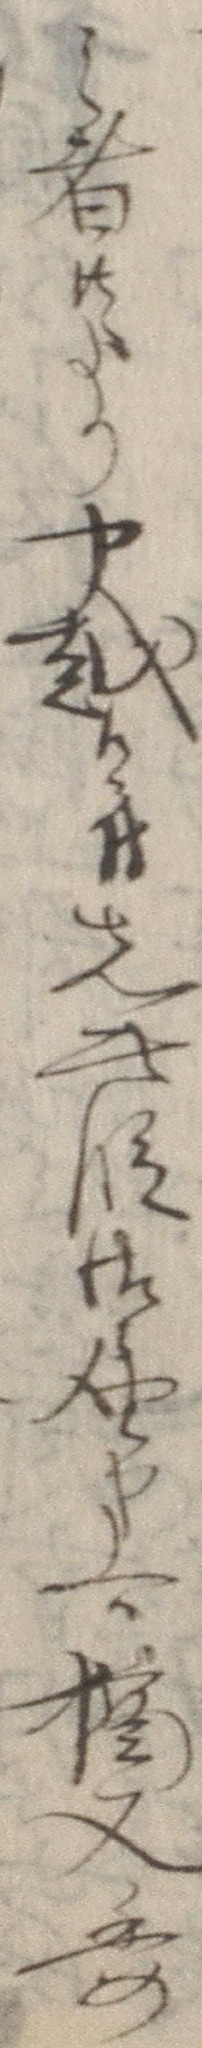之者共より申越候ニ付先此段御届申上候猶又委
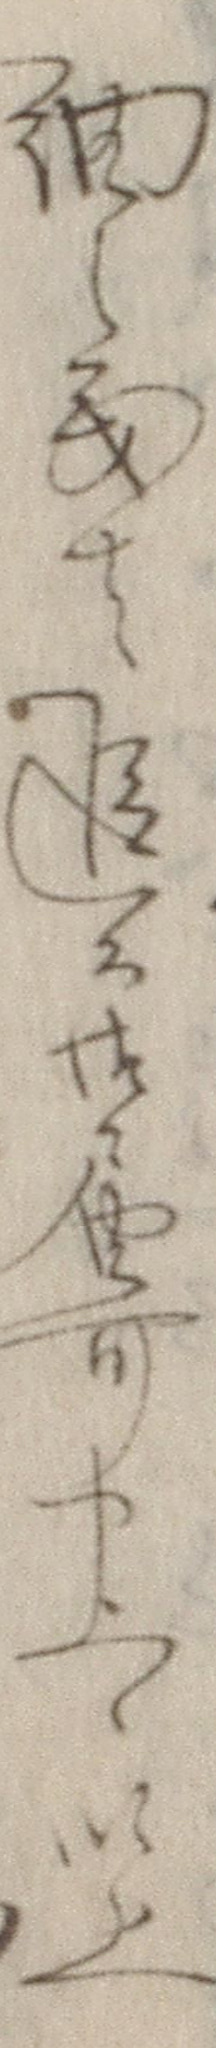細之義は追而御届可申上候以上
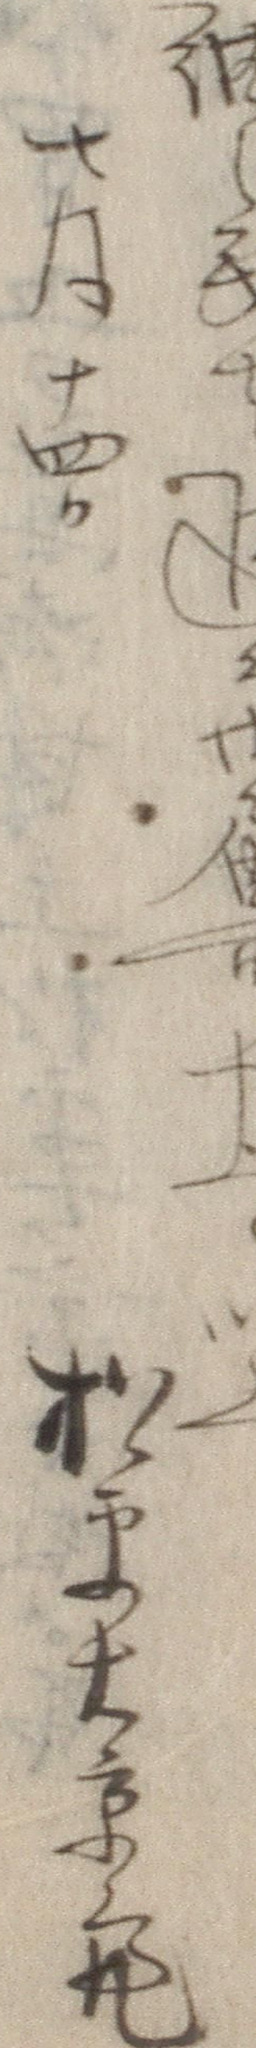七月十四日松平右京亮
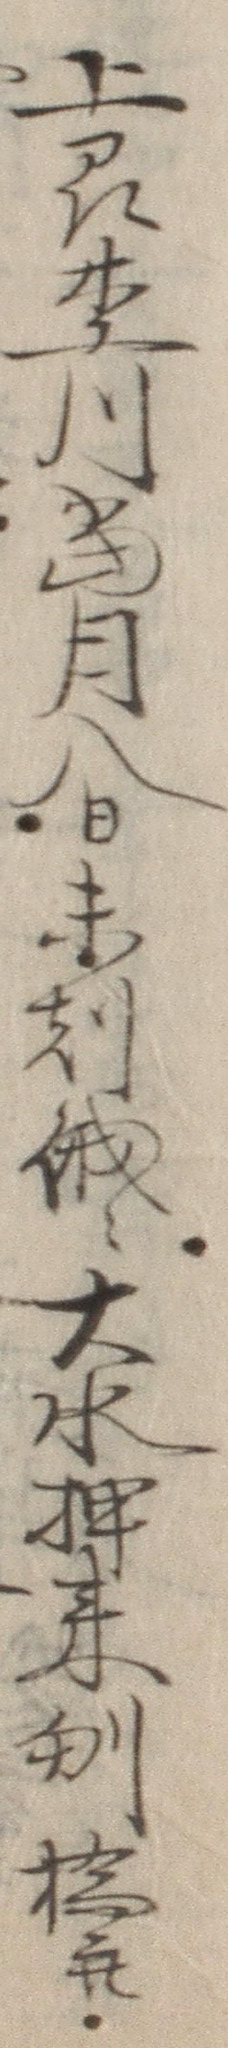上州杢川当月八日未刻俄ニ大水押来刎橋并
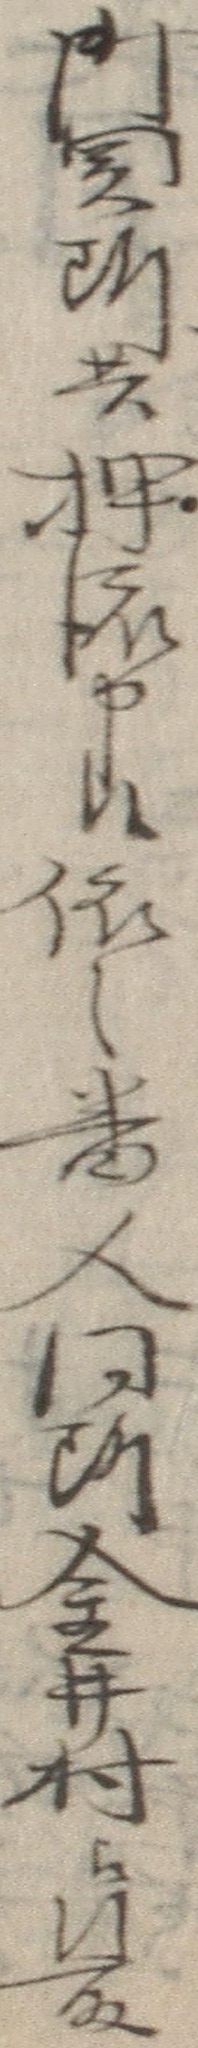御関所共押流申候依之番人同所金井村え引取
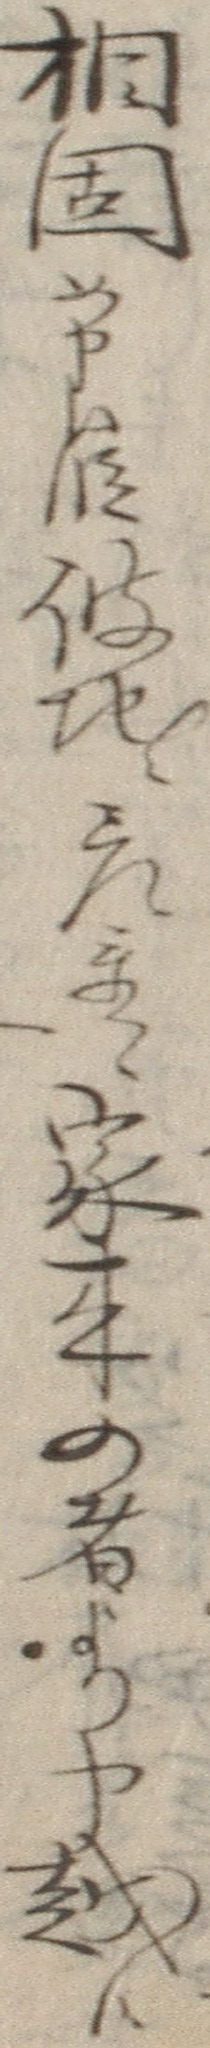相固め申候段彼地ニ差置候家来の者より申越候
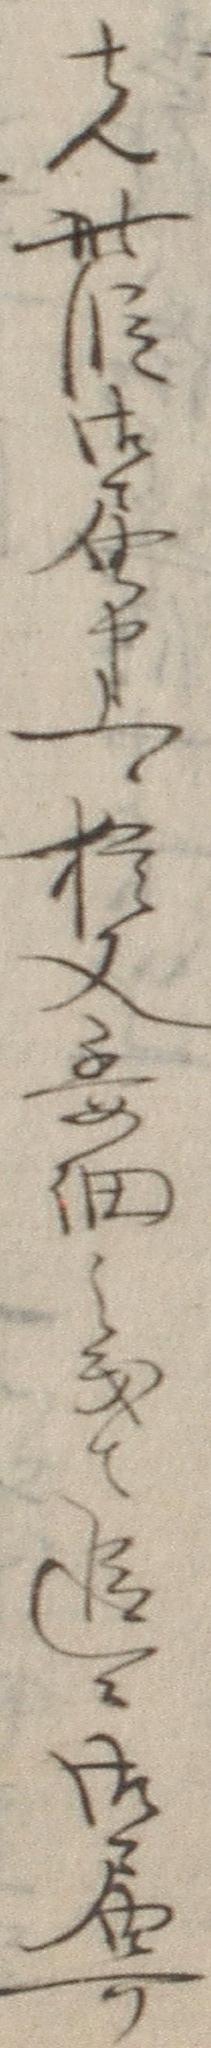先此段御届申上候猶又委細之義は追而御届可
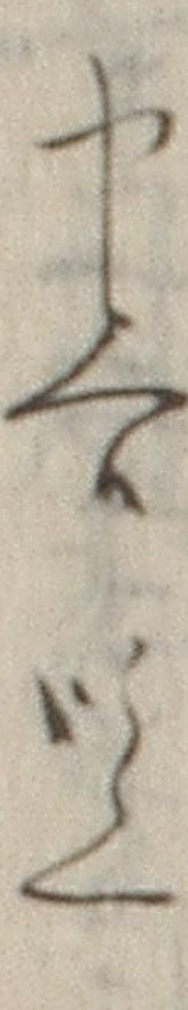申上候以上
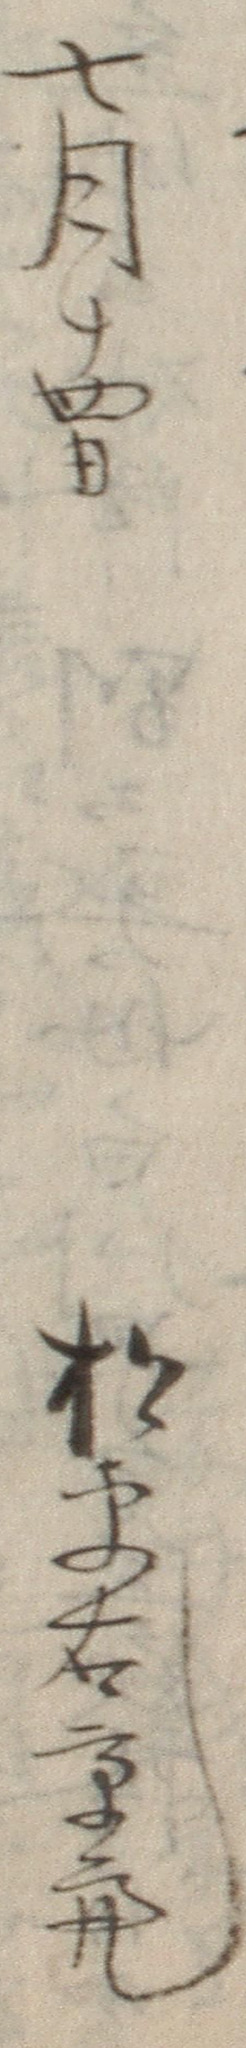七月十四日松平右京亮
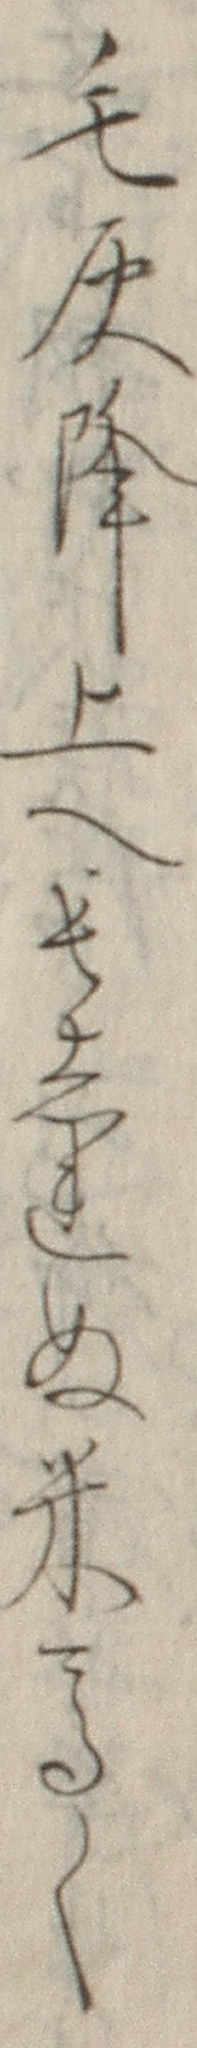毛灰降上へもしれぬ米高く
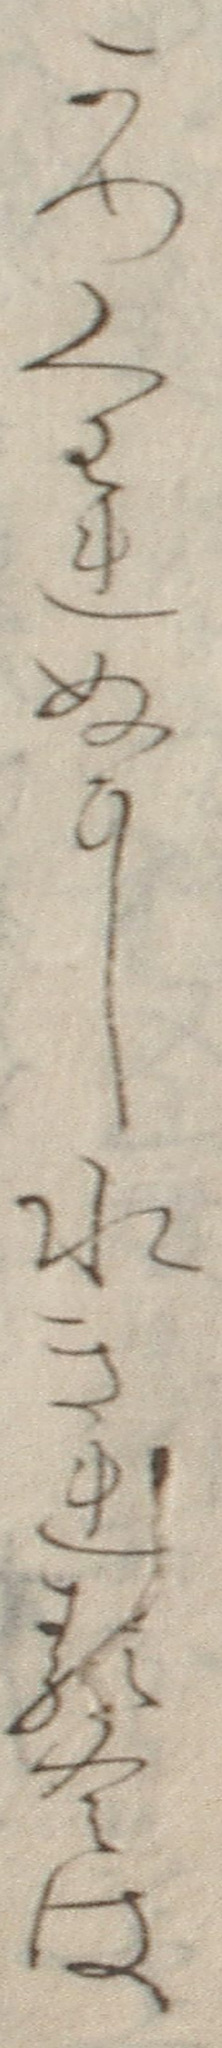かわくわれぬに水きれる冬は
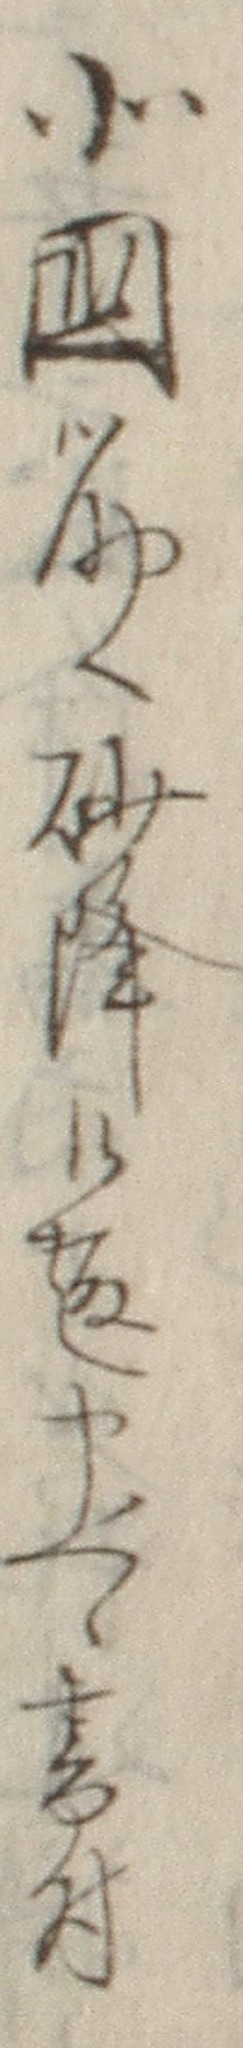北国筋へ砂降候趣申上候書付
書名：[諸国災害記録]
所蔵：東京大学地震研究所図書室 Earthquake Research Institute Library, The University of Tokyo, JAPAN
